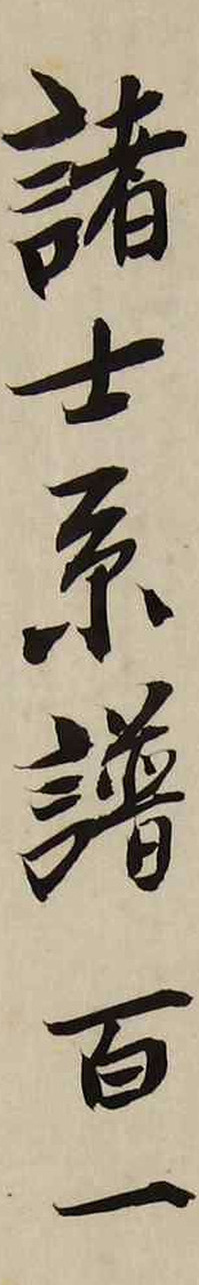諸士系譜百一
